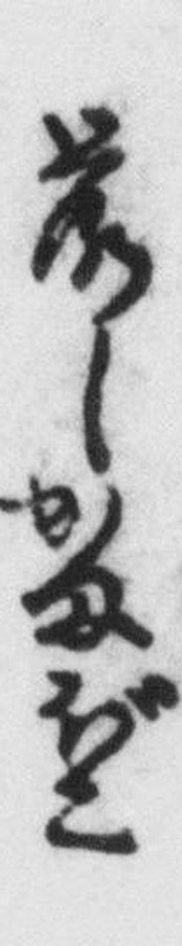落しかまぼこ

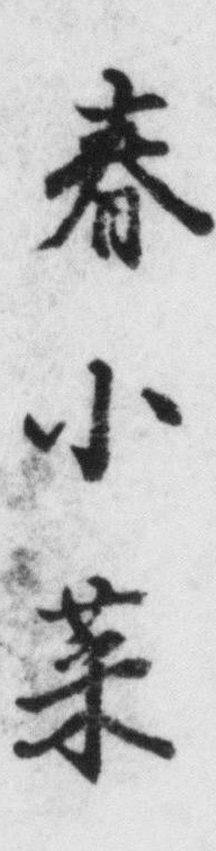春小菜
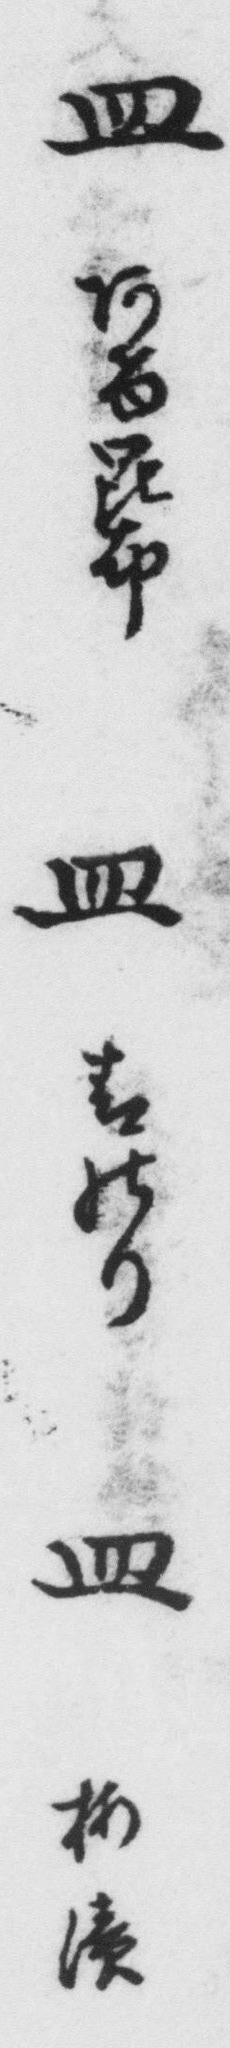皿あま昆布皿青のり皿梅漬
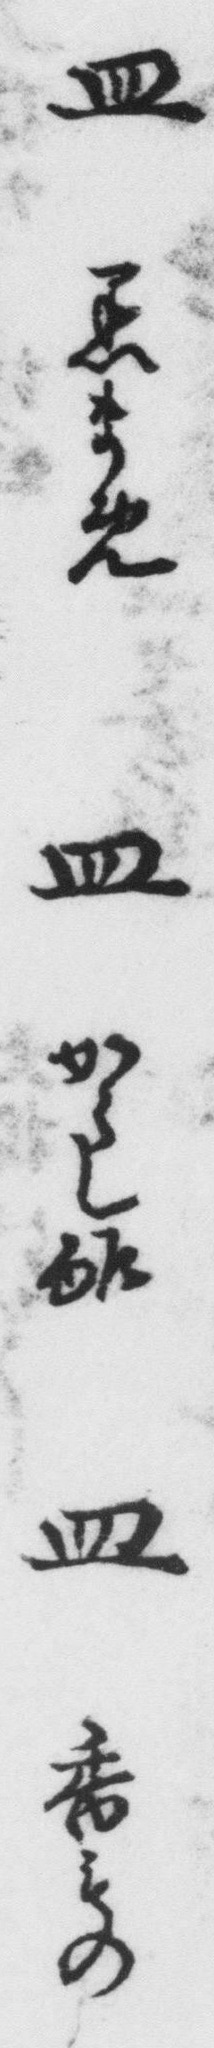皿黒まめ皿からし酢皿香もの
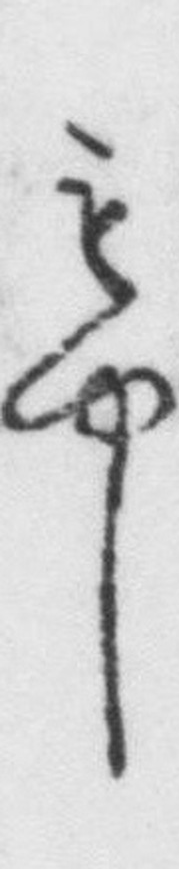もやし

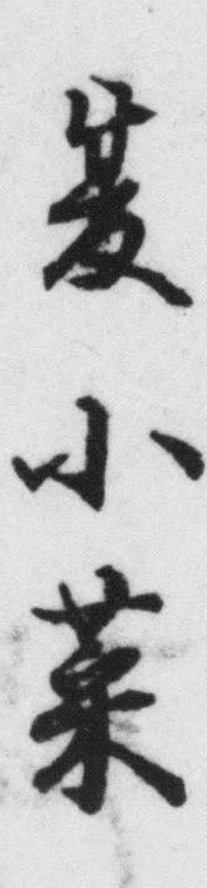夏小菜
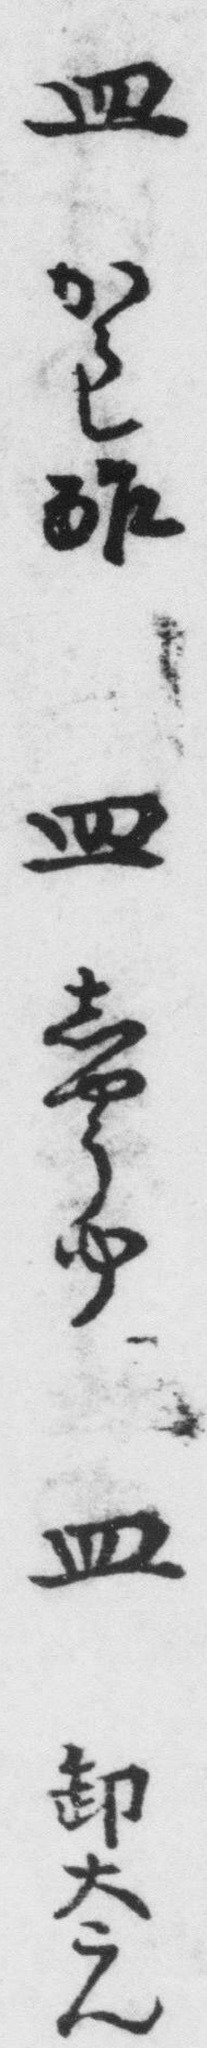皿からし酢皿しやうゆ皿卸大こん

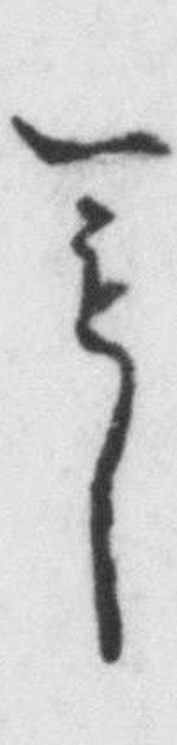一もし
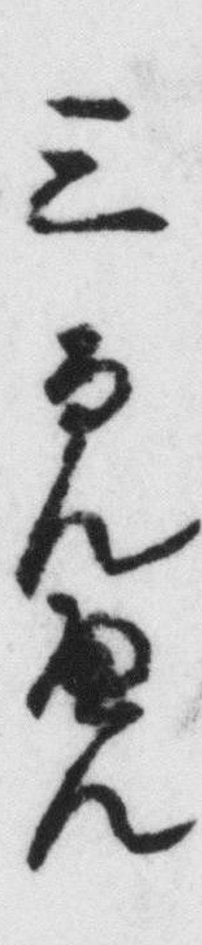小はんへん
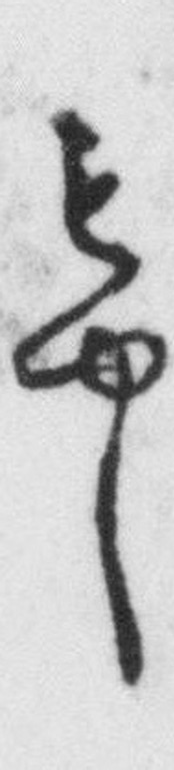もやし
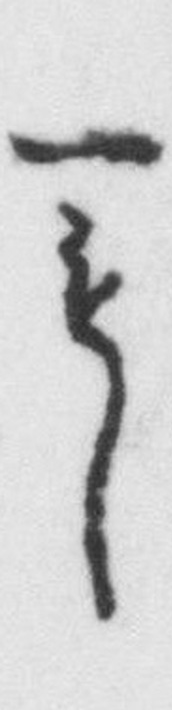一もし
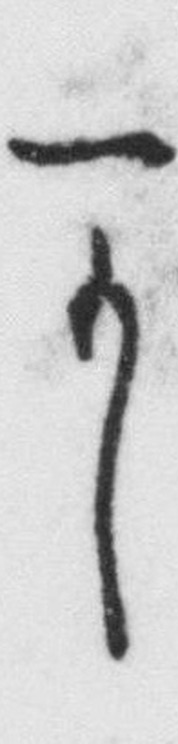一かし
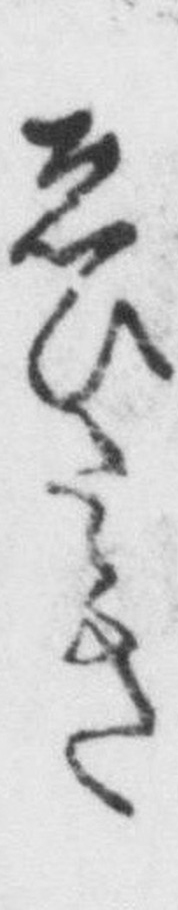ゑひたゝき
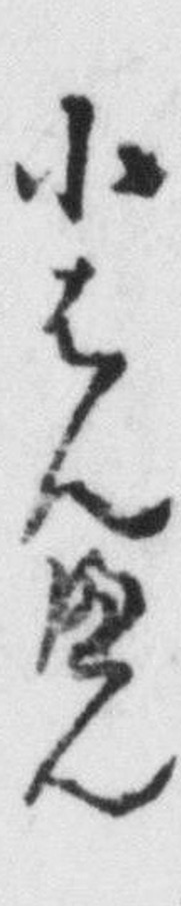小はんへん

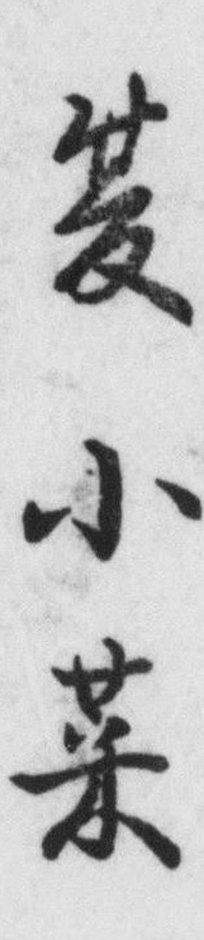夏小菜
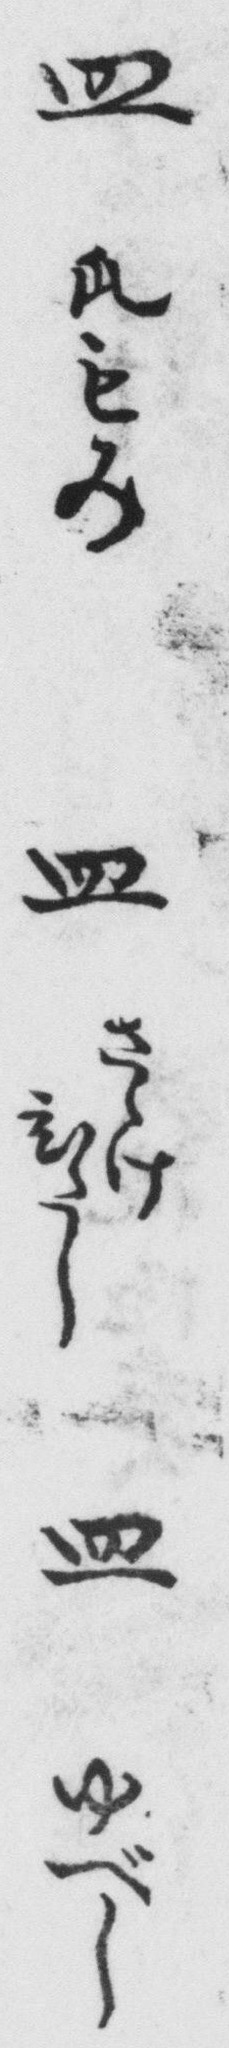皿瓜もみ皿さゝけ皿ゆべし
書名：卓子料理仕様
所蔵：大阪府立大学学術情報センター 国文学研究資料館
